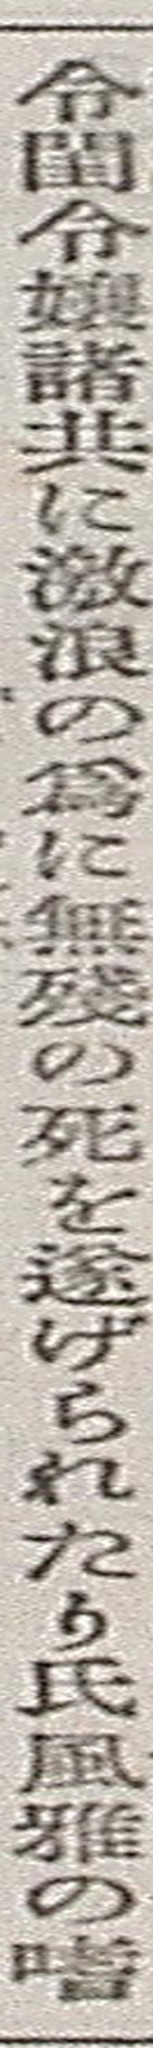令閨令嬢緒共に激浪の為に無残の死を遂げられたり氏風雅の嗜
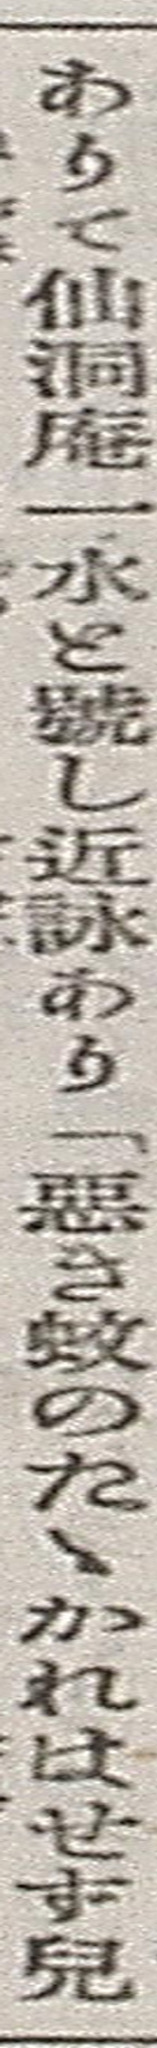ありて仙洞庵一水と号し近詠あり「悪き蚊のたゝかれはせず兒
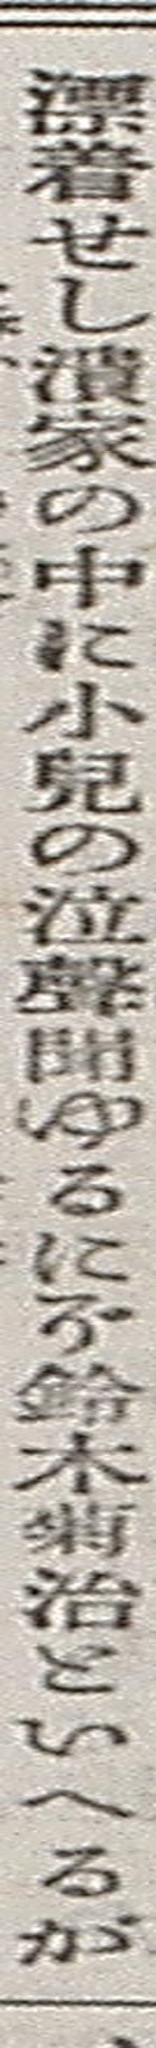漂着せし潰家の中に小兒の泣声聞ゆるにぞ鈴木菊治といへるが
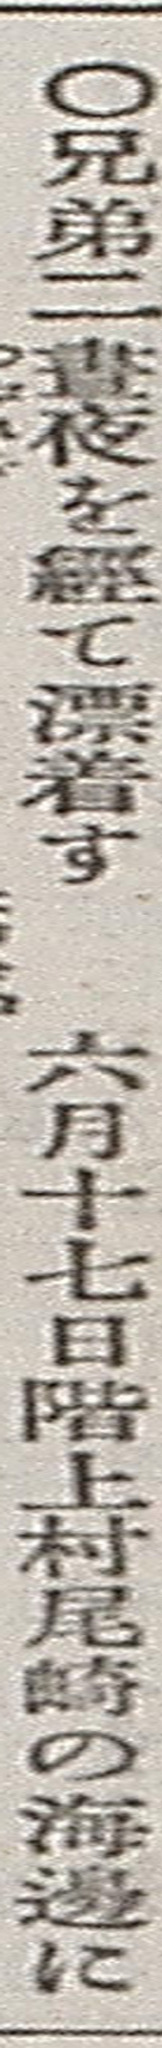○兄弟二昼夜を経て漂着す六月十七日階上村小崎の海辺に
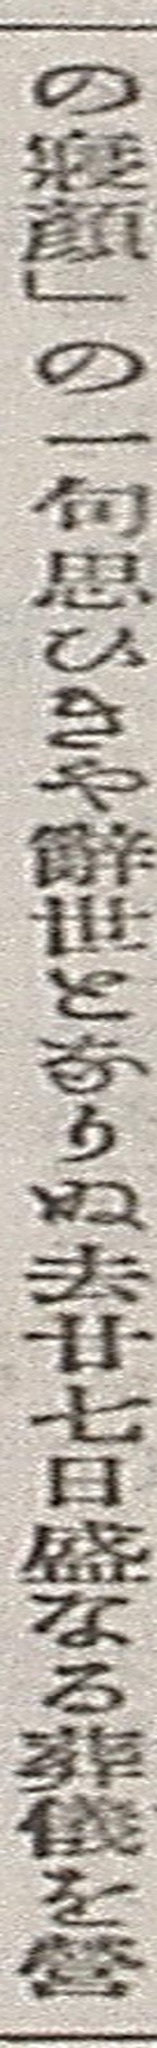の寝顔」の一句思ひきや辞世となりぬ去廿七日盛なる葬儀を営
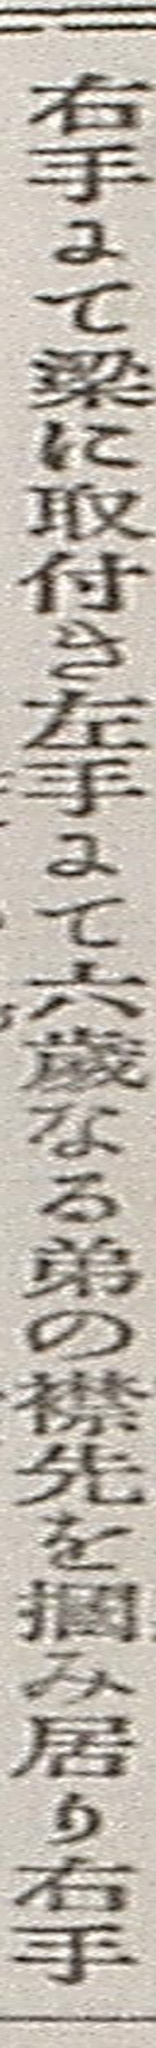右手にて梁に取付き左手にて六歳なる弟の襟先を掴み居り右手
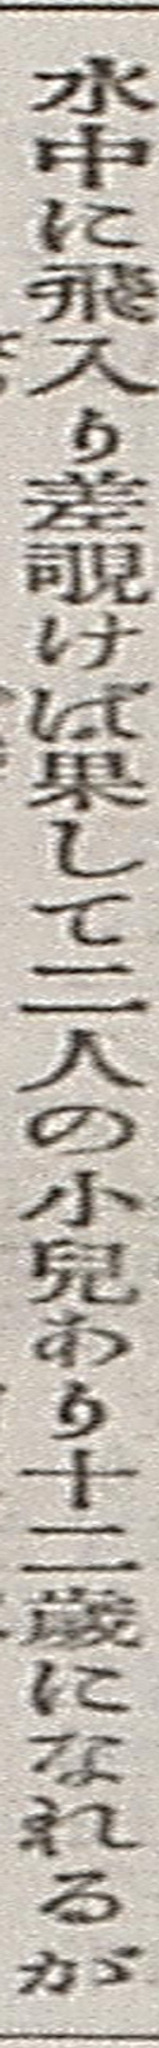水中に飛入り差覗けば果して二人の小兒あり十二歳になれるが
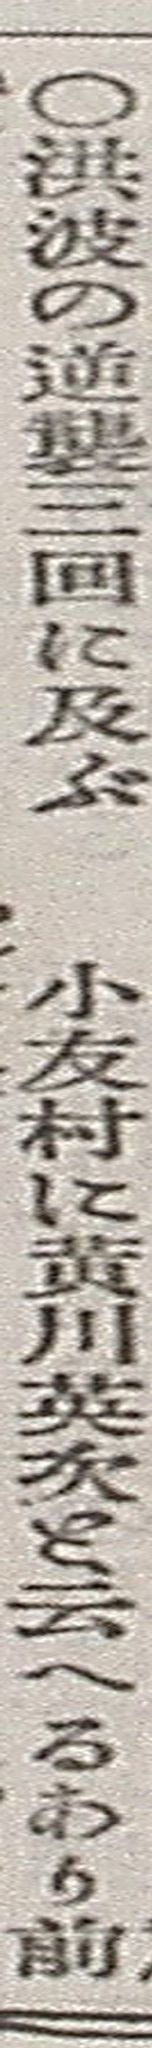○洪波の逆襲三回に及ぶ小友村に黄川英次と云へるあり前
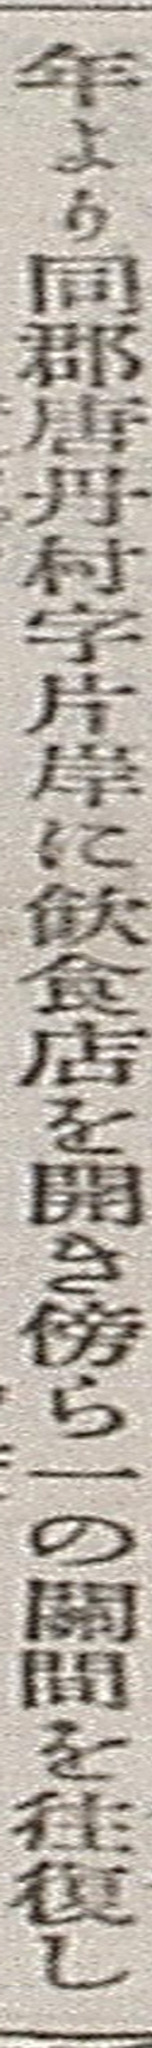年より同郡唐丹村字片岸に飲食店を開き傍ら一の関間を往復し
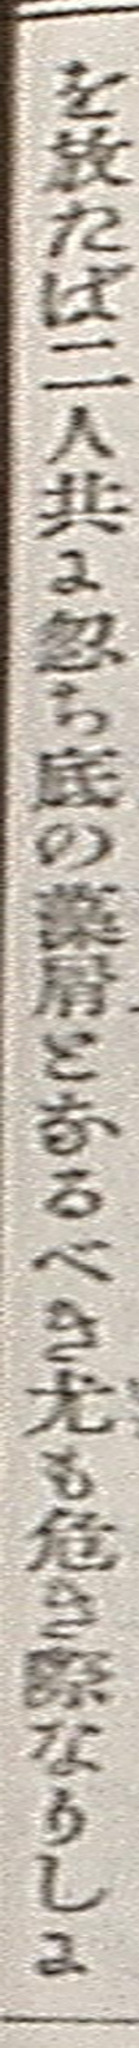を放たば二人共に忽ち底の藻屑となるべき尤も危き際なりしに
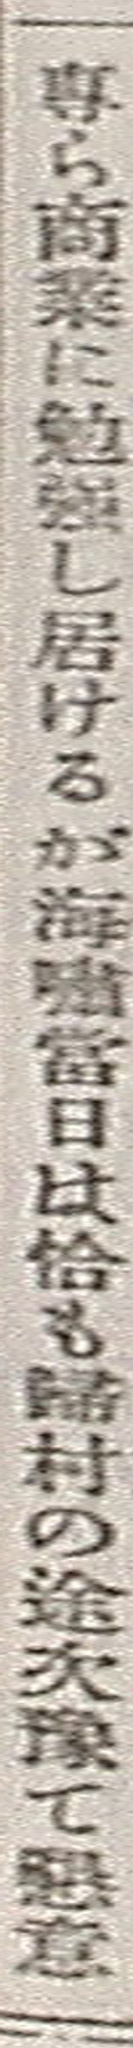専ら商業に勉強し居けるが海嘯当日は恰も帰村の途次予て懇意

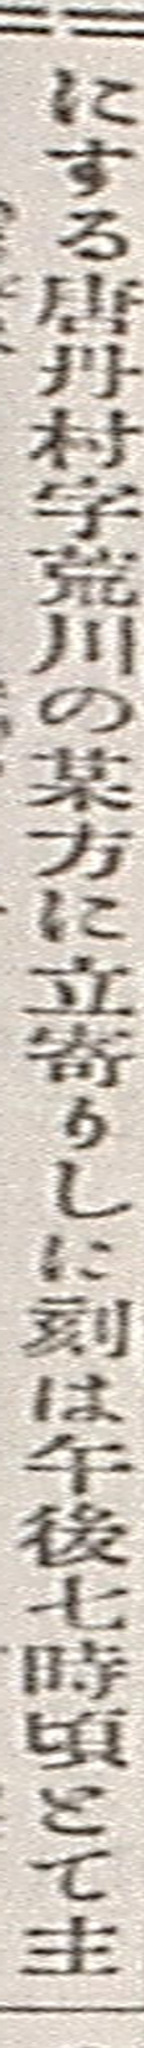にする唐丹村字荒川の某方に立寄りしに刻は午後七時頃とて主
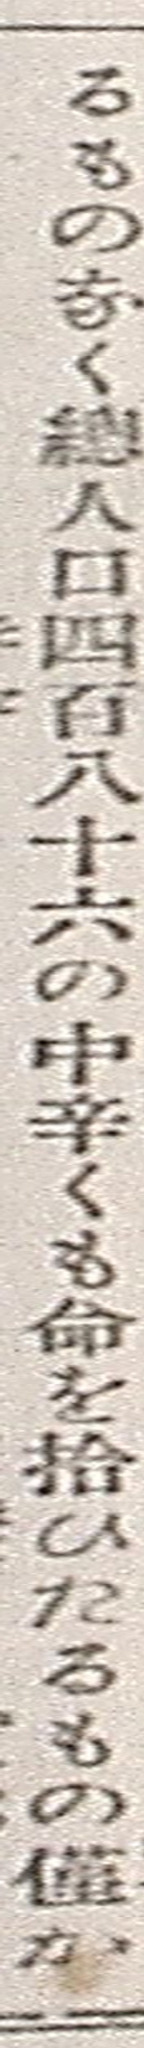るものなく総人口四百八十六の中辛くも命を拾ひたるもの僅か
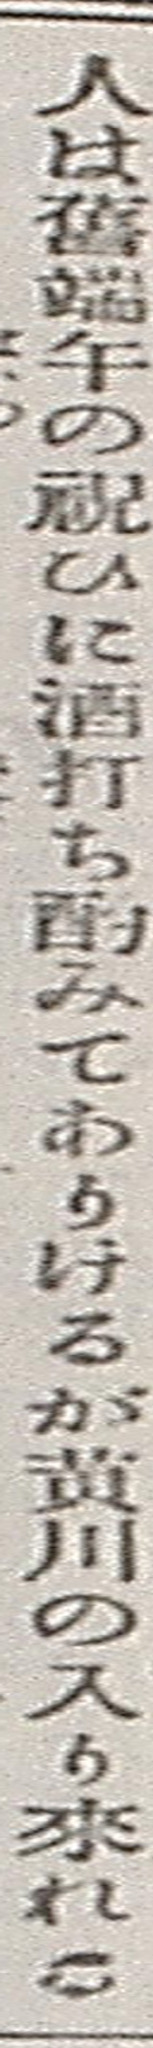人は旧端午の祝ひに酒打ち酌みてありけるが黄川の入り来れる
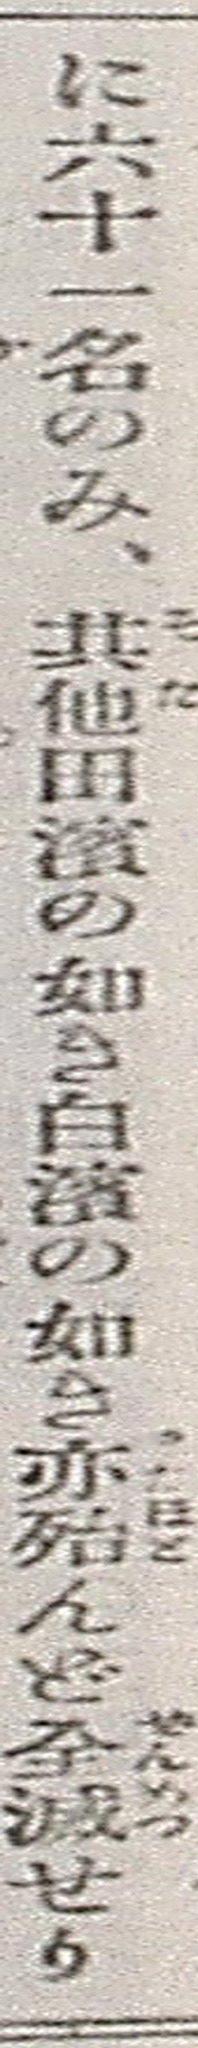に六十一名のみ、其他田浜の如き白浜の如き亦殆んど全滅せり
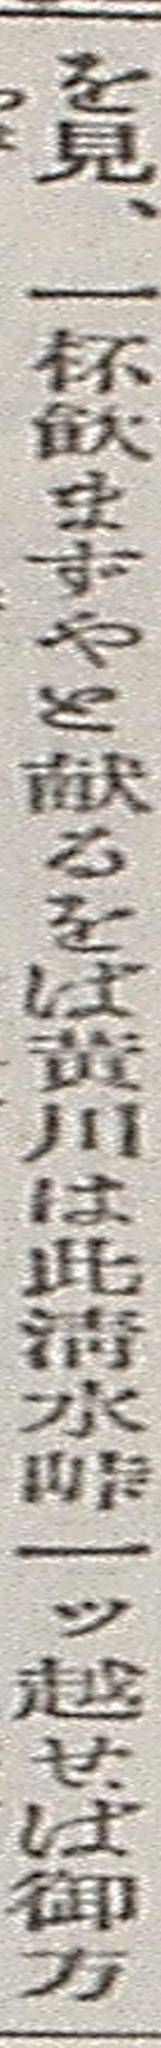を見、一杯飲まずやと献るをば黄川は此清水峠一ッ越せば御方
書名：風俗畫報臨時増刊第百二十號　大海嘯被害録（下）
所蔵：東京大学地震研究所図書室 Earthquake Research Institute Library, The University of Tokyo, JAPAN
